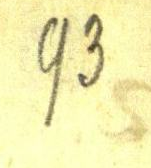93
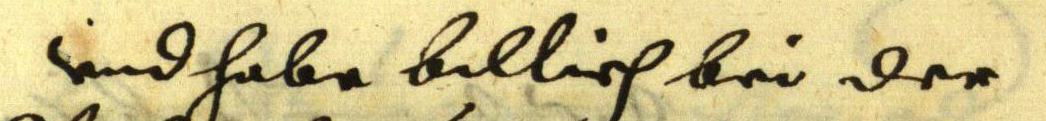vnd habe billich bei der
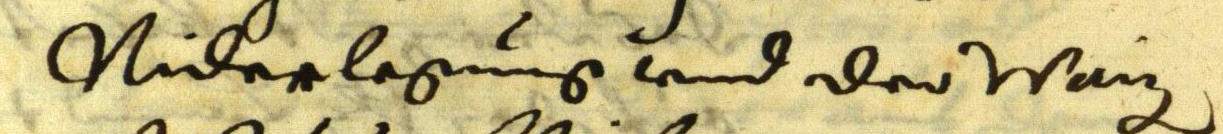Niderlegūng vnd der Waizen
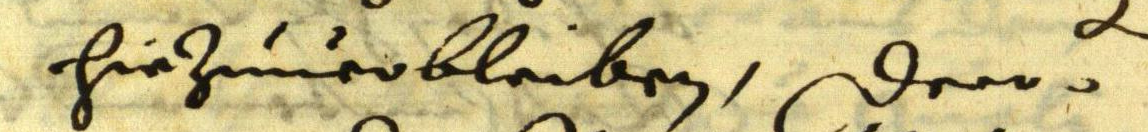hie Zūūerbleiben, dero¬
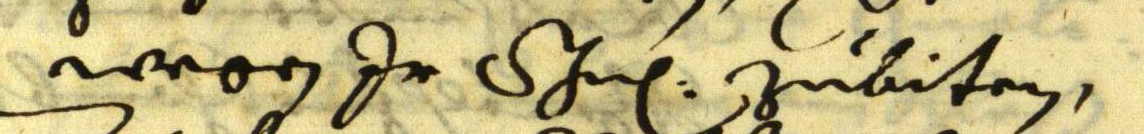wegen Ir Gn: zūbiten,
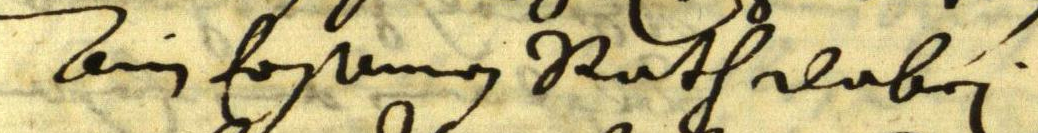Ain Ersamen Rath dabej
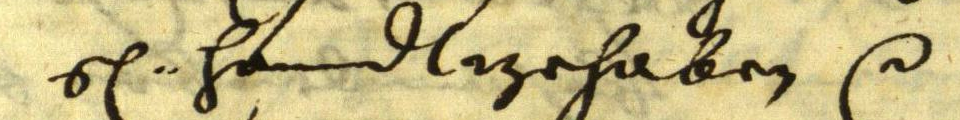g: hanndtzehaben etc.
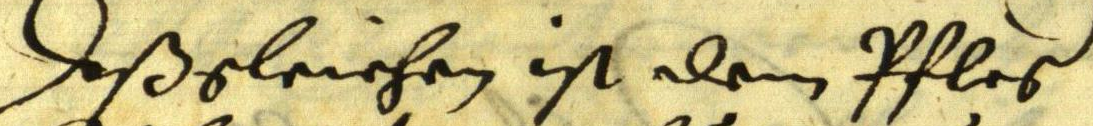Deßgleichen ist dem Pfleg
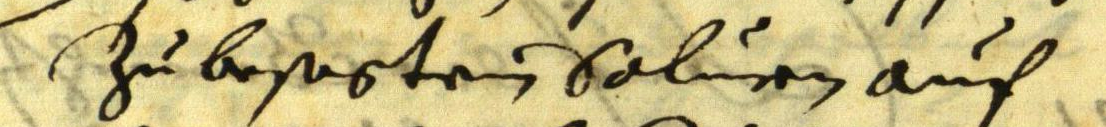Zū besagtem Salūrn aūf
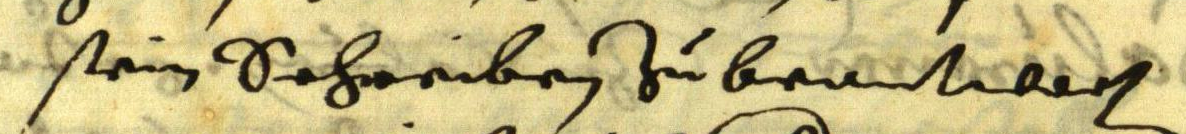sein schreiben Zū beantwort.
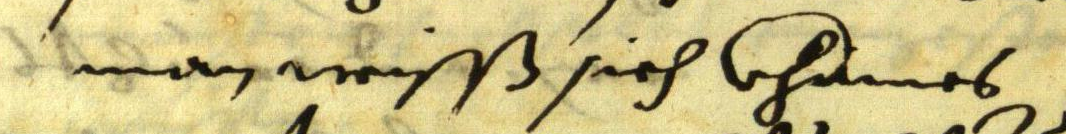man wisß sich khaines
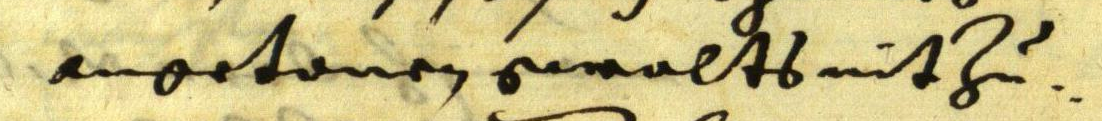angetanen gewalts nit Zū¬
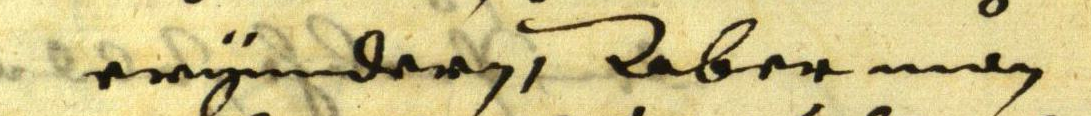erÿnndern, Aber man
